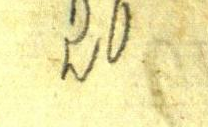20
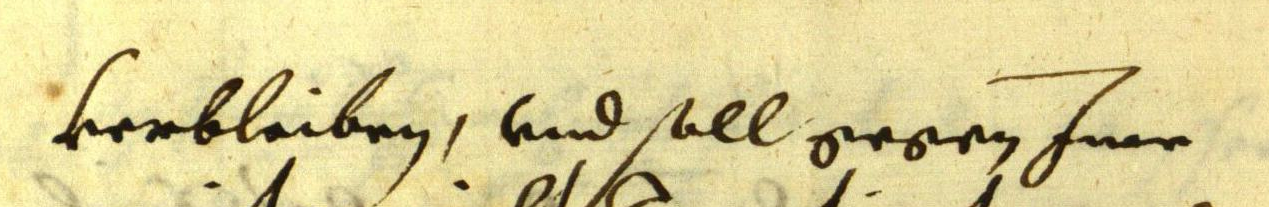verbleiben, vnd soll gegen Ime
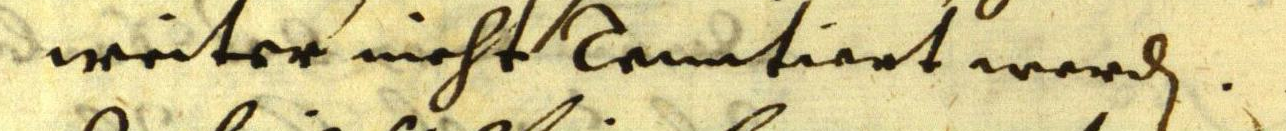weiter nicht Tenntiert werd.
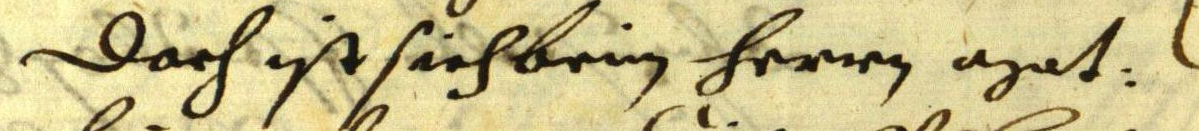doch ist sich beim herrn Mat¬
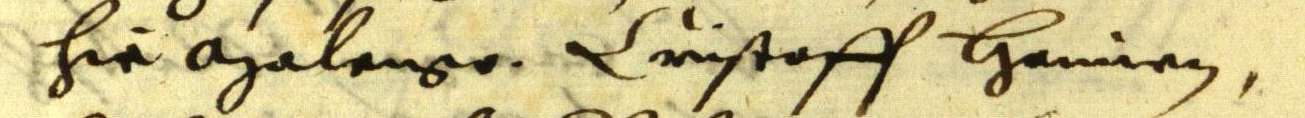hie Malenge. Cristoff Haimen,
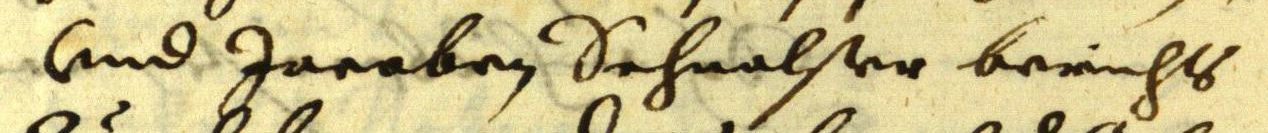vnd Jacoben Schnalser berichts
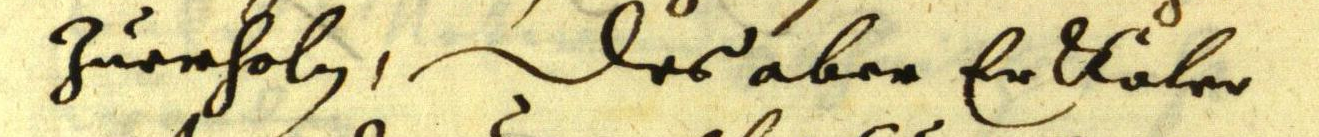Zūerholn, Des aber Er Koler
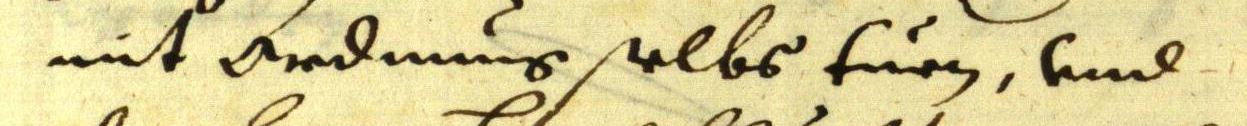mit Ordnūng selbs tūen, vnd
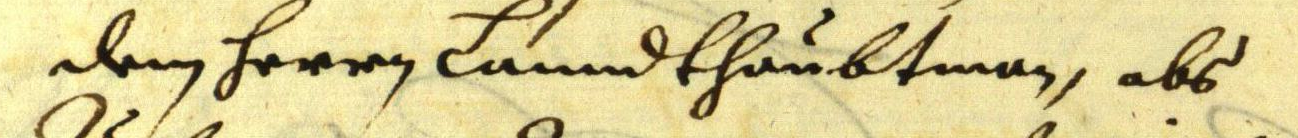dem herrn Lanndthaūbtman, als
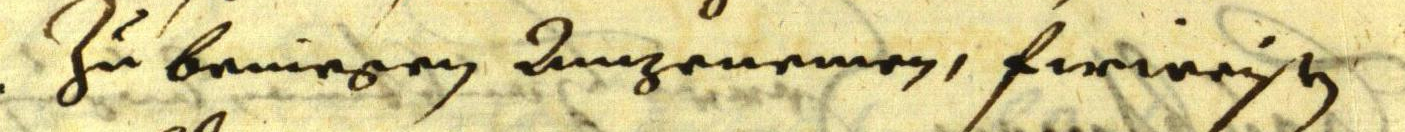Zū beniegen Anzenemen, firweisn
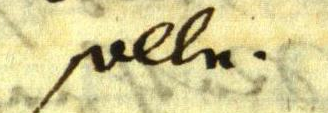solle.
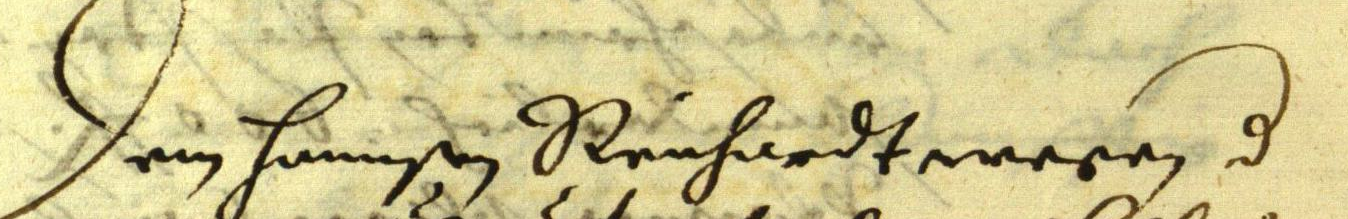Dem hannsen Reichardt wegen d
